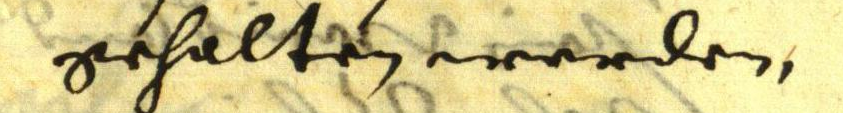gehalten werden,
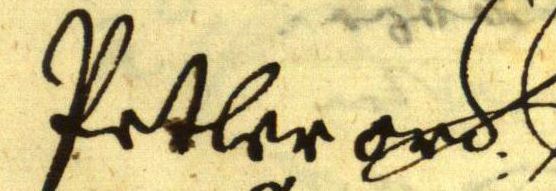Petler ord¬
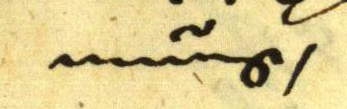nūng,
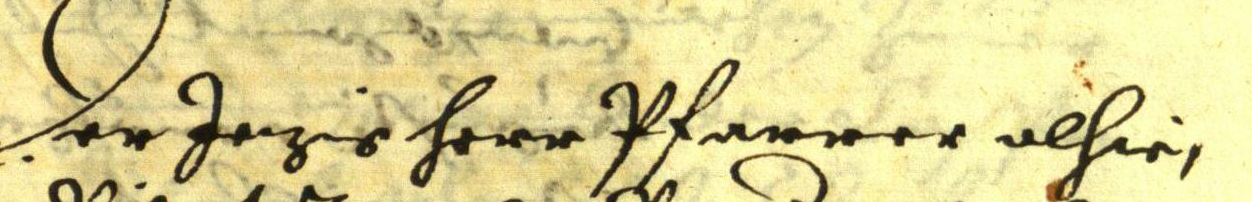Der Jezig herr Pfarrer alhie,
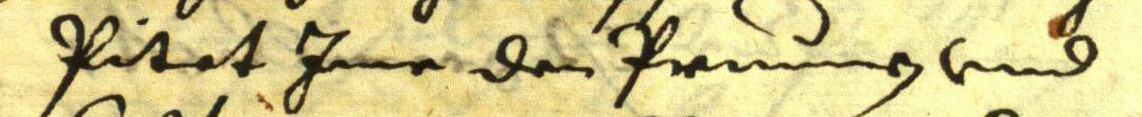Pitet Ime den Prūnnen vnd
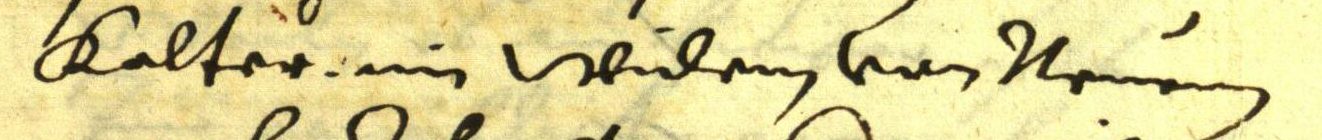Kalter. im Widem von Neūem
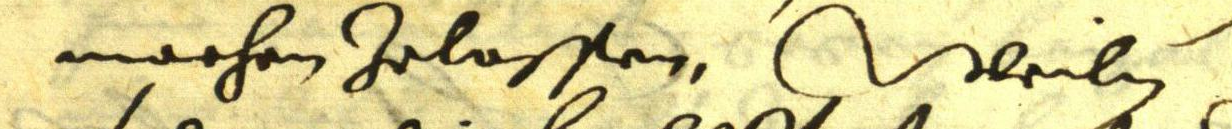machen Zelassen, Weiln
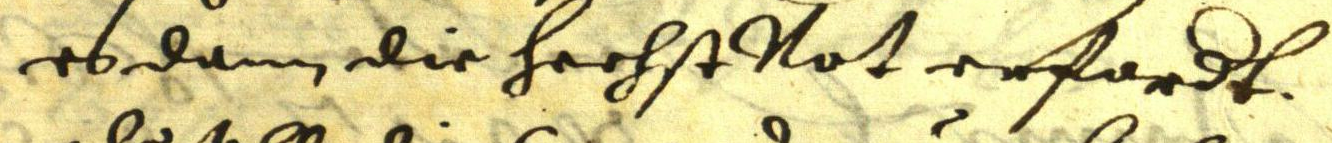es dann die hechst Not erfordt.
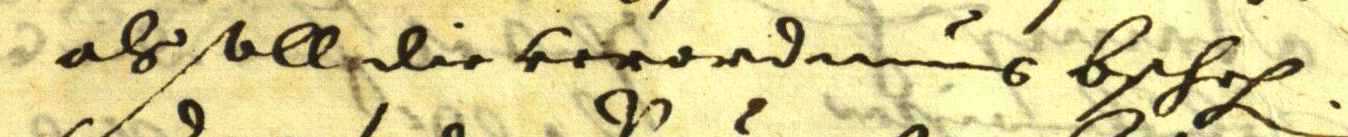als soll die verordnūng bscheh.
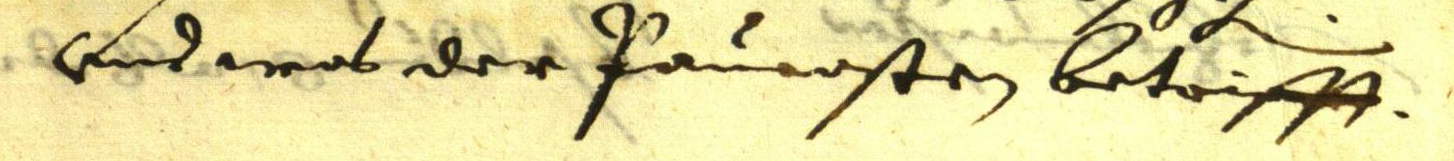vnd was der Paūcosten betrifft.
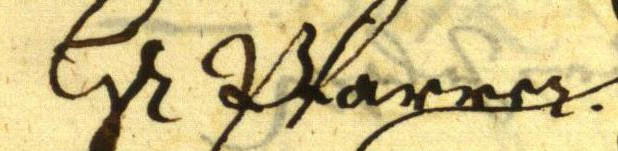H Pfarrer
